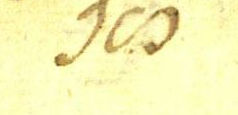18
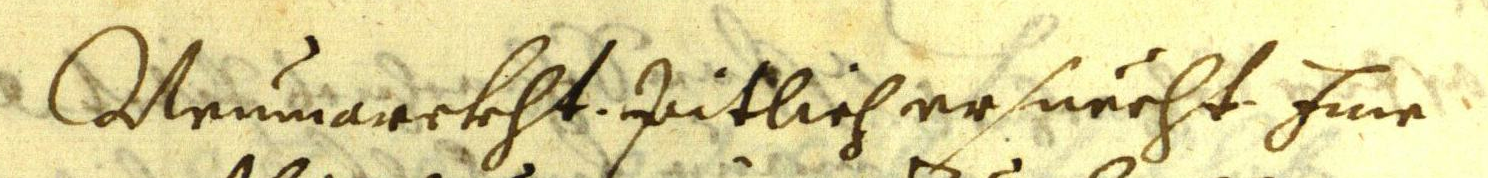Neūmarckht, Pitlich ersūecht Ime
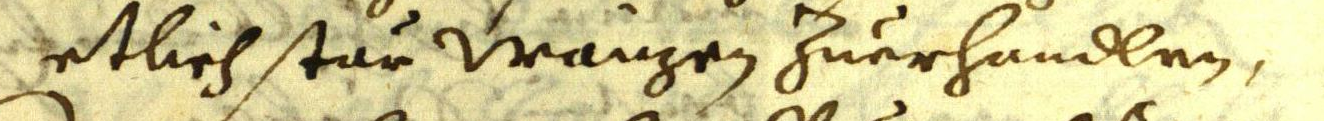etlich stār Waizen Zūerhandlen,
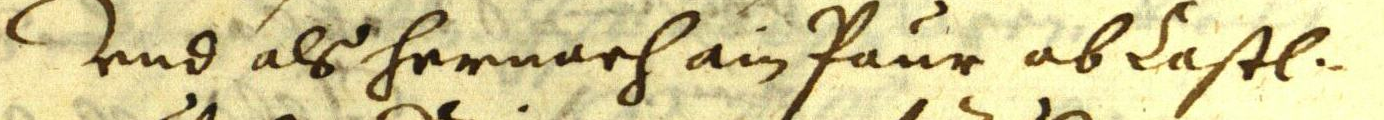Vnd als hernach ain Paūr ob Castl¬
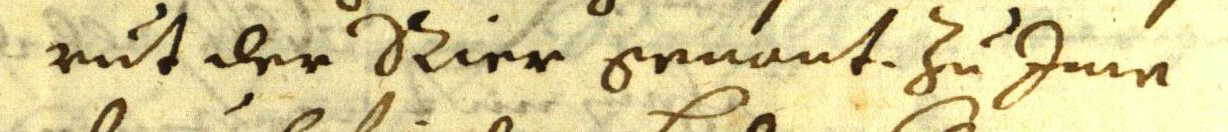rūt der Rier genant. Zū Ime
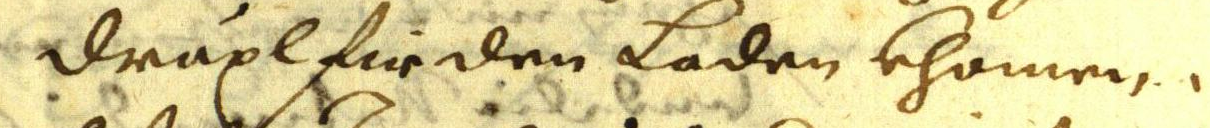drāxl fir den Laden khomen,
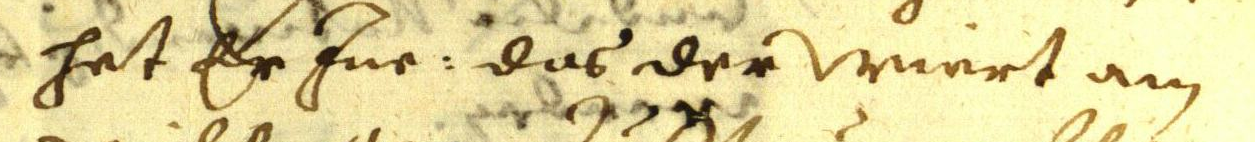het Er Ine: das der Wiert am
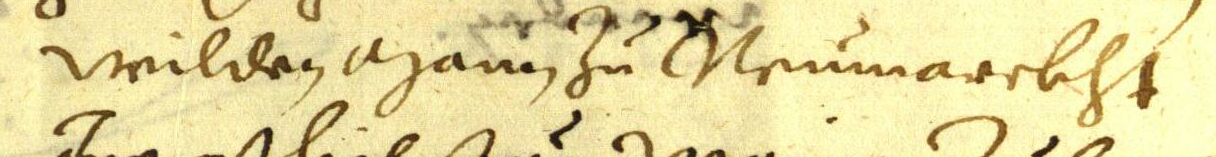wilden Mann Zū Neūmarckht
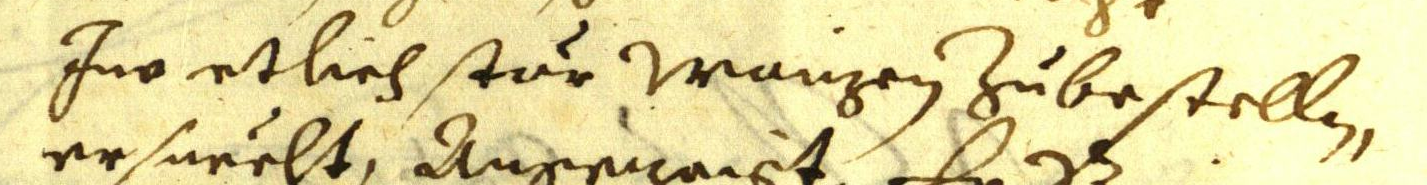Ine etlich stār Waizen Zūbestelln,
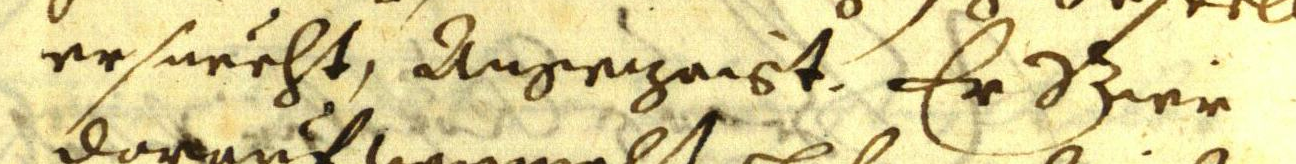ersūecht, Angezaigt. Er Rier
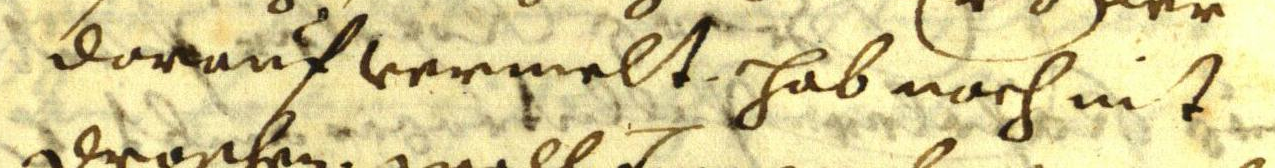daraūf vermelt. Hab noch nit
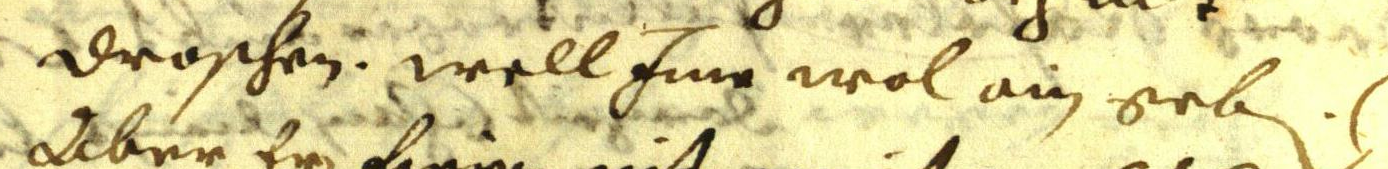droschen. well Ime wol ain geb.
